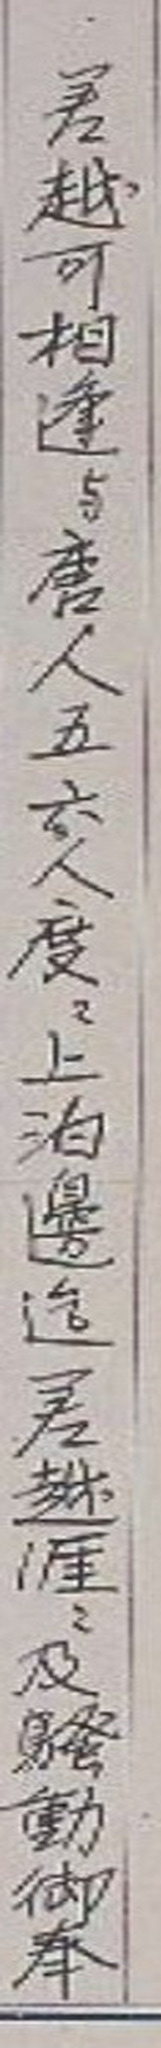差越可相逢と唐人五六人度々上泊辺迄差越涯々及騒動御奉
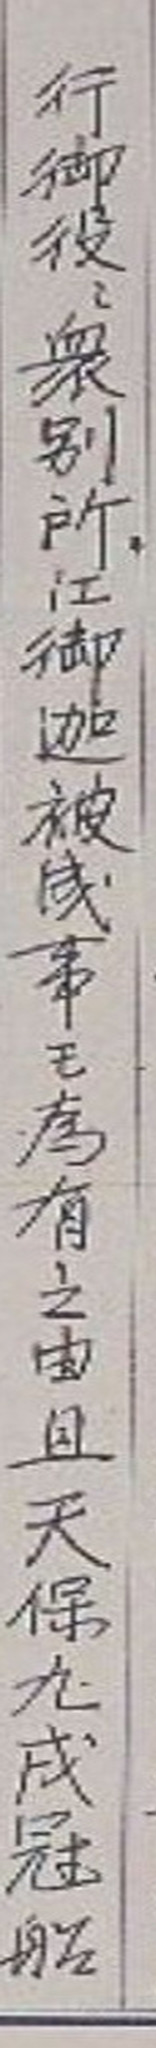行御役々衆別所え御迦被成事も為有之由且天保九戌冠船
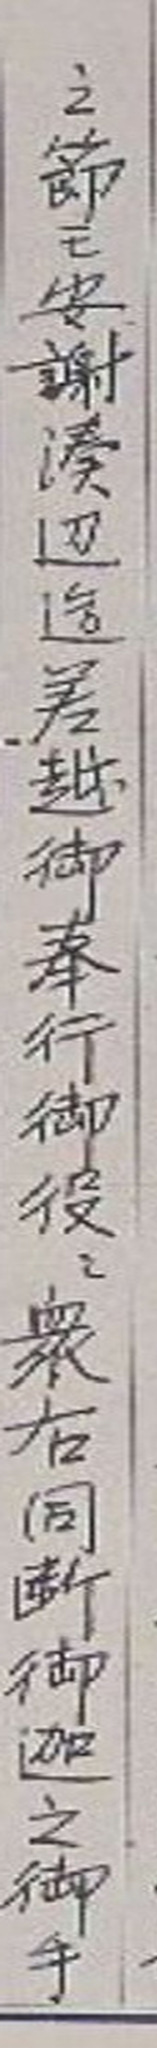之節も安謝湊辺迄差越御奉行御役々衆右同断御迦之御手
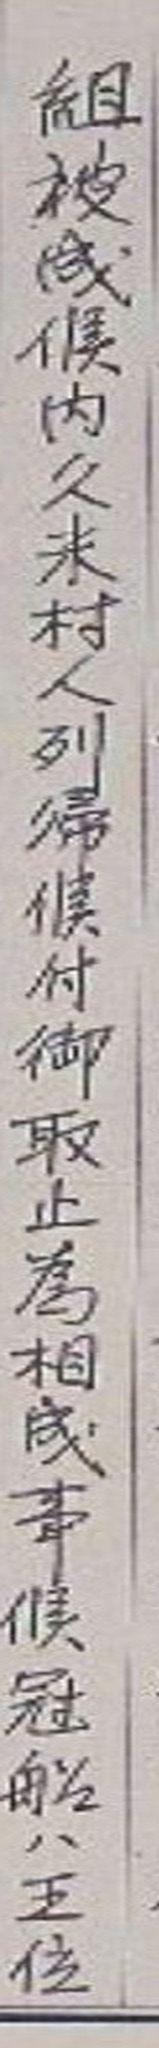組被成候内久米村人列帰候付御取止為相成事候冠船は王位
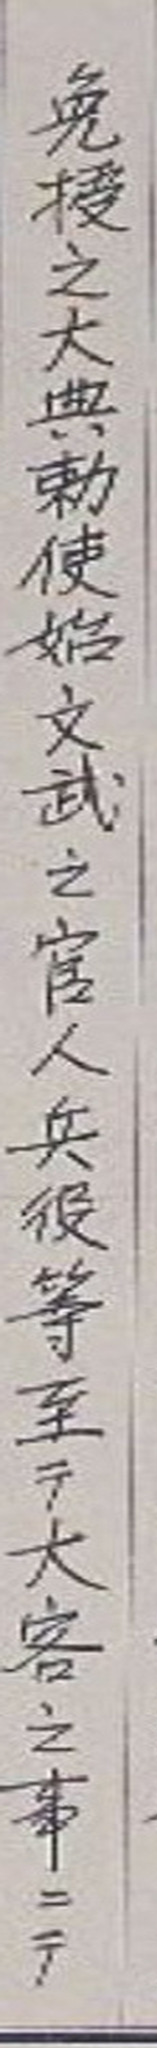免授之大典勅使始文武之官人兵役等至て大客之事にて
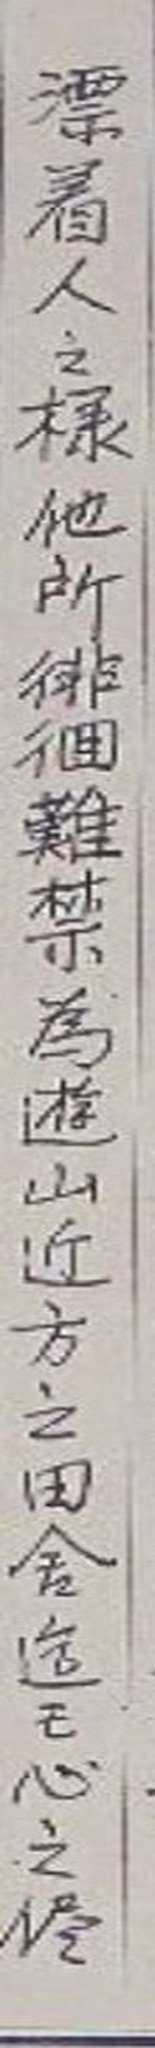漂着人之様他所徘徊難禁為遊山近方之田舎迄も心之儘
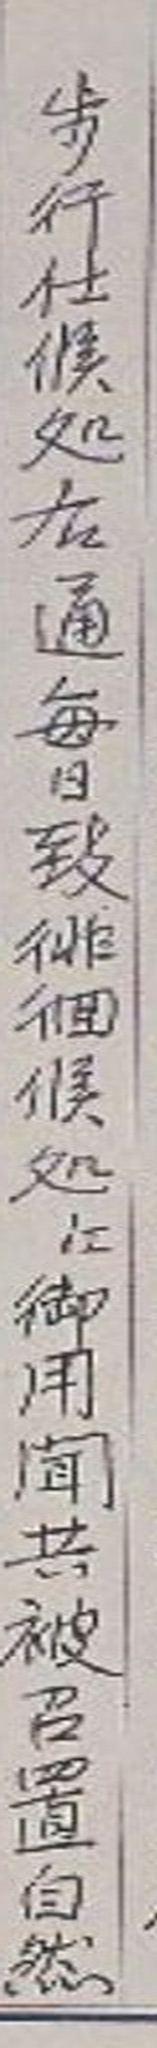歩行仕候処右通毎日致徘徊候処え御用聞共被召置自然
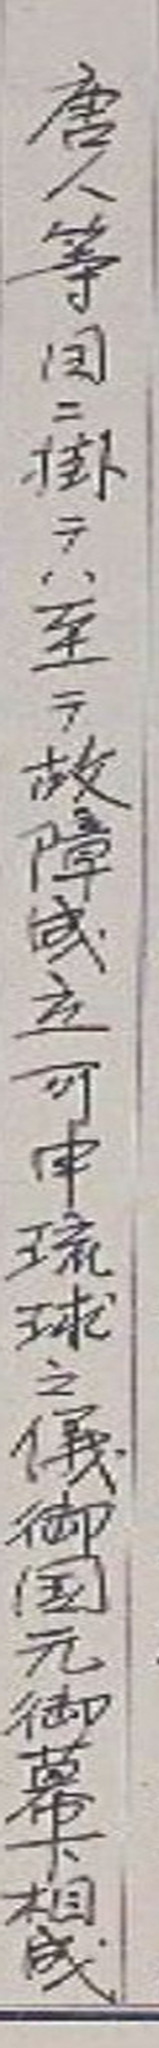唐人等目に掛ては至て故障成立可申琉球之儀御国元御幕下相成
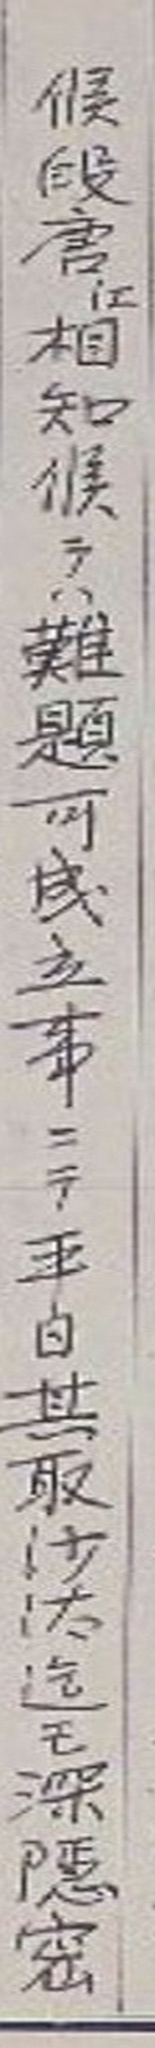候段唐え相知候ては難題可成立事にて平日其取沙汰迄も深隠密
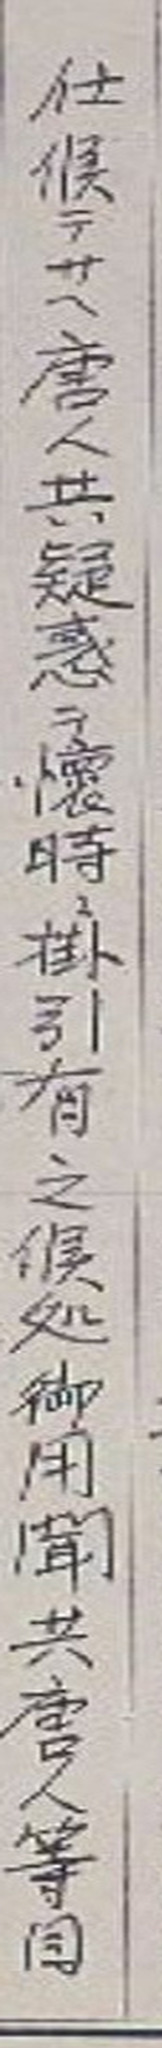仕候てさへ唐人共疑惑を懐時々掛引有之候処御用聞共唐人等目
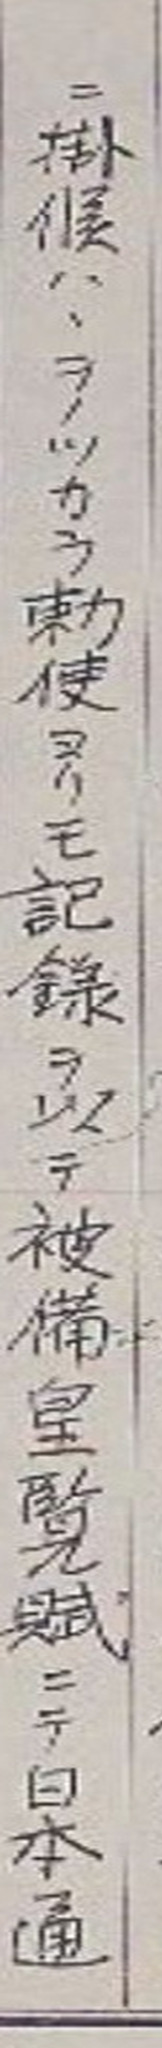に掛候はゝをのつから勅使よりも記録を以て被備皇覧賦にて日本通
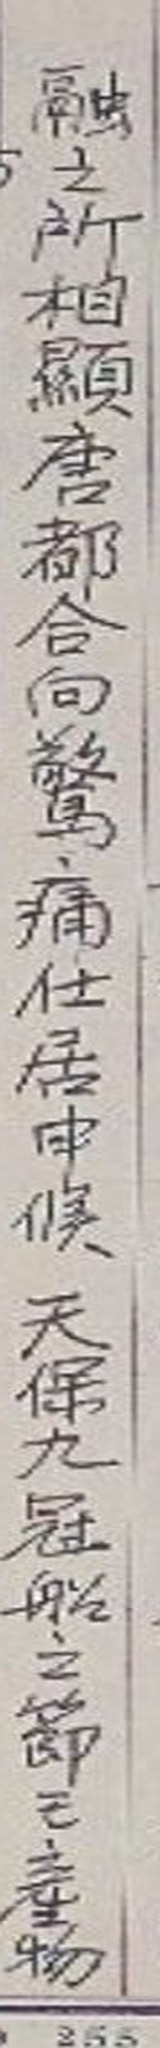融之所相顕唐都合向驚痛仕居申候天保九冠船之節も産物
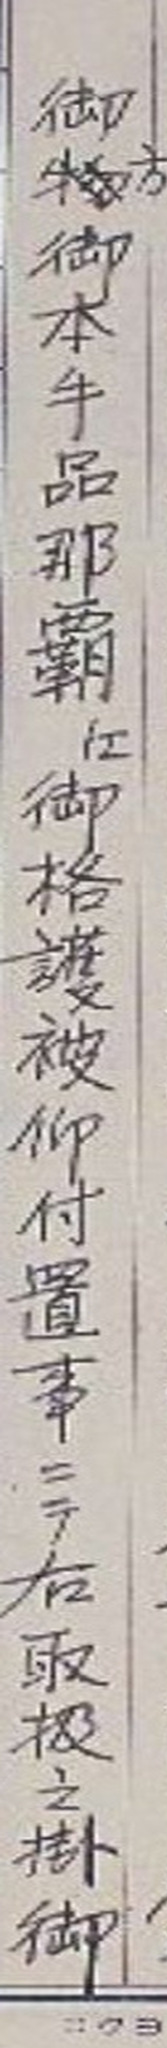御方御本手品那覇え御格護被仰付置事にて右取扱之掛御
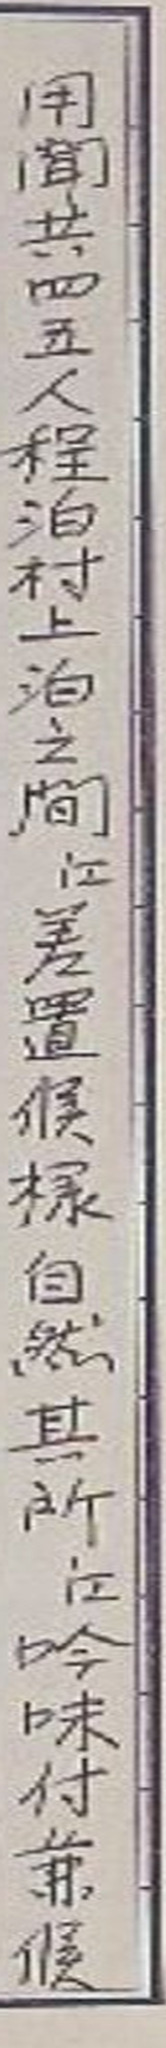用聞共四五人程泊村上泊之間え差置候様自然其所え吟味付兼候
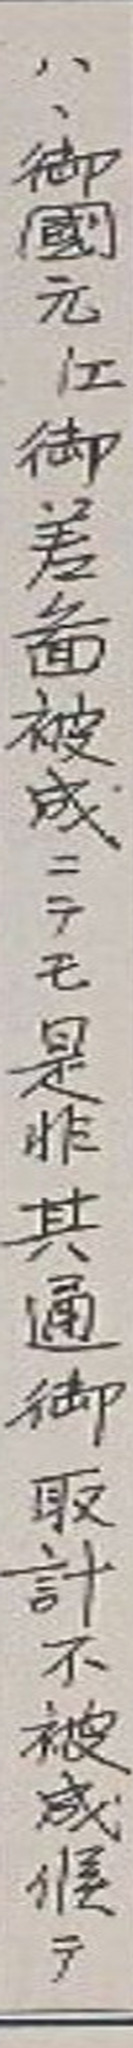はゝ御国元え御差図被成にても是非其通御取計不被成候て
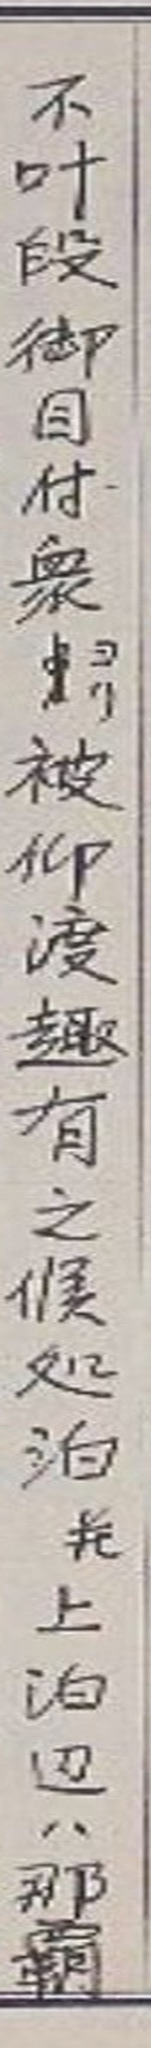不叶段御目付衆より被仰渡趣有之候処泊并上泊辺は那覇
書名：支那冊封使来琉諸記 下巻
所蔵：University of the Ryukyus Library
